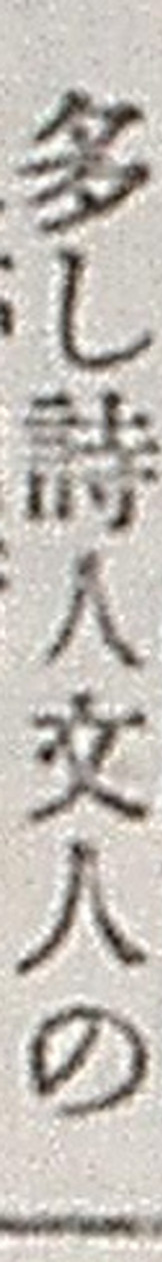多し詩人文人の
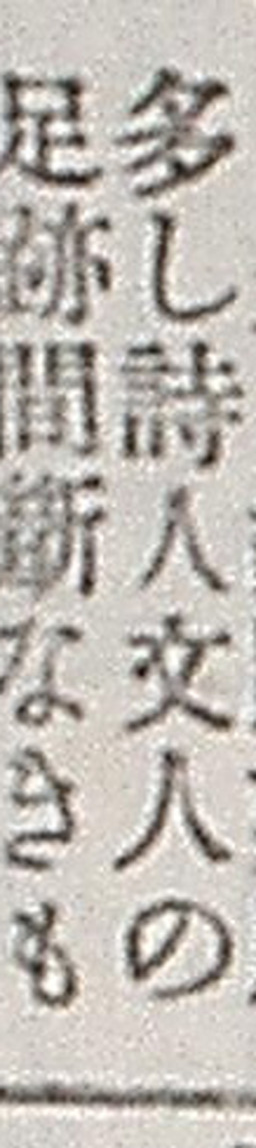足跡間断なきも
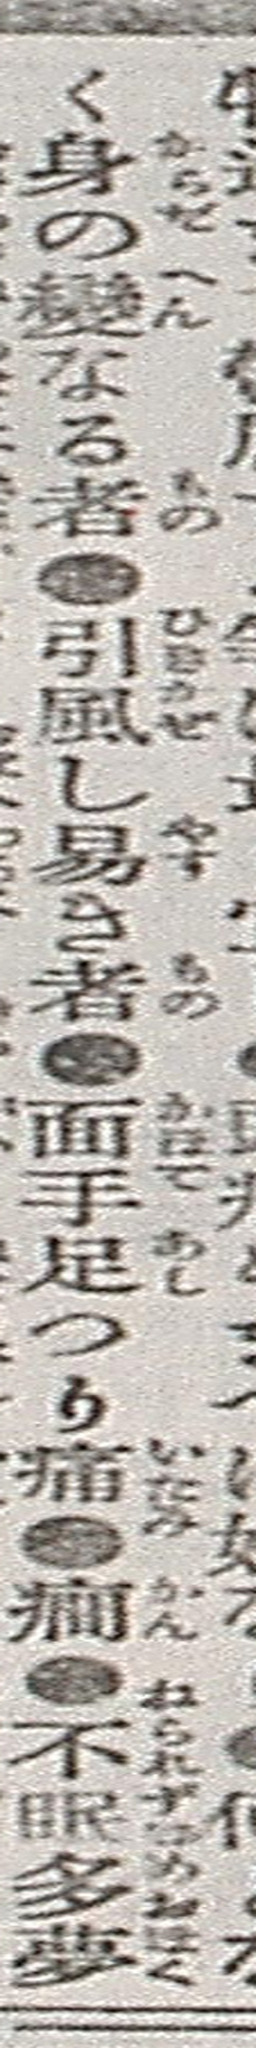く身の変なる者●引風し易き者●面手足つり痛●癇●不眠多夢
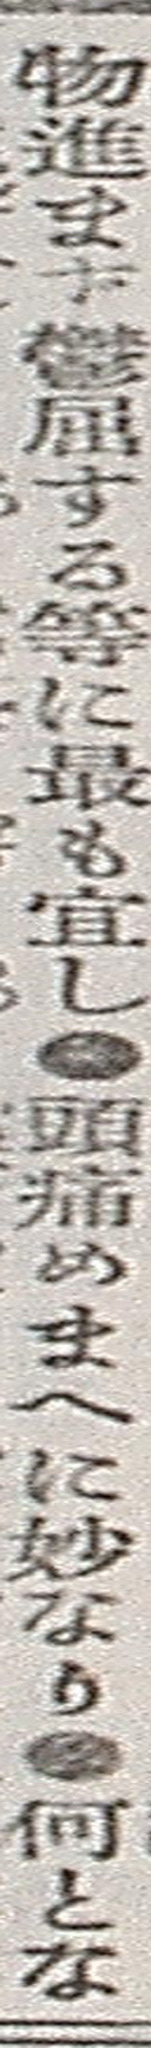物進まず鬱屈する等に最も宜し●頭痛めまへに妙なり●何とな
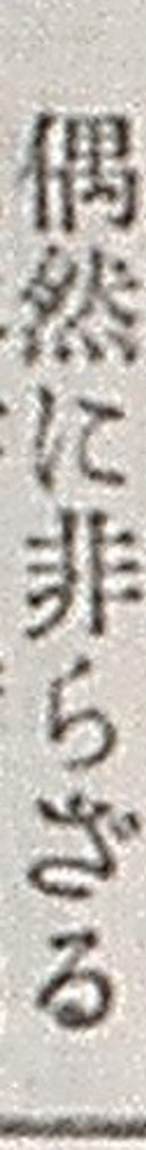偶然に非らざる
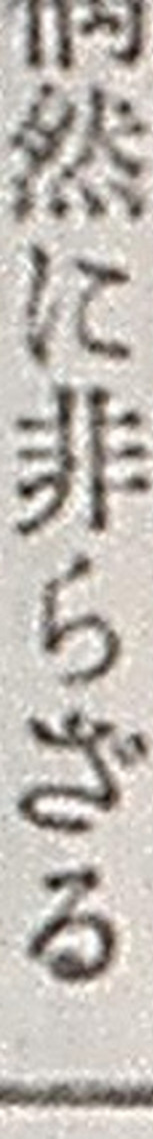偶然に非らざる
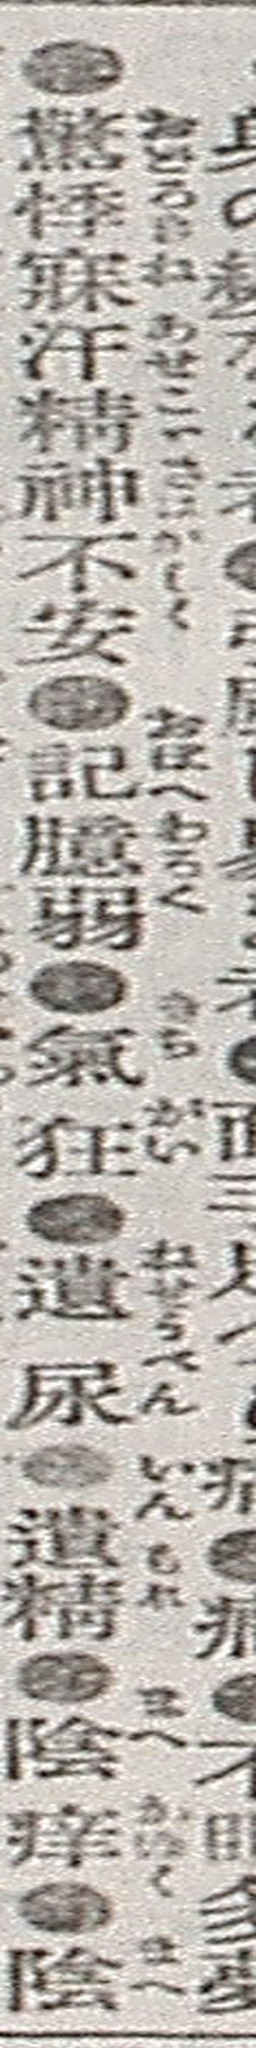●驚悸寝汗精神不安●記憶弱●気狂●遺尿●遺精●陰痒●陰
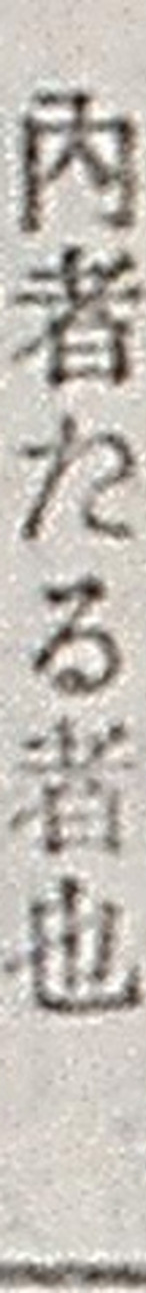内者たる者也
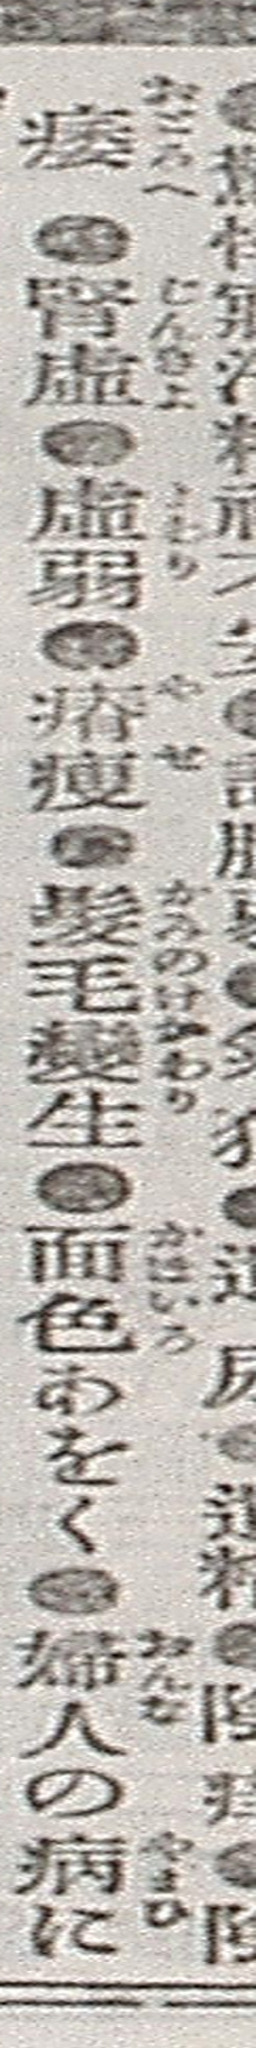痿●腎虚●虚弱●瘠痩●髪毛変生●面色あをく●婦人の病に
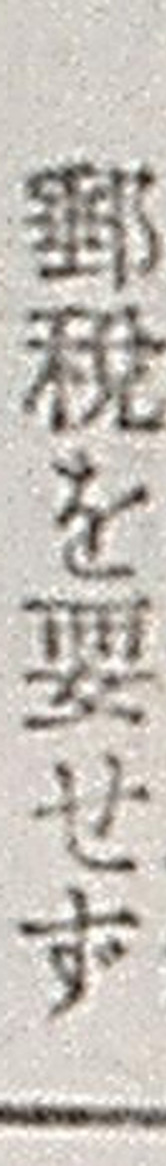郵税を要せず
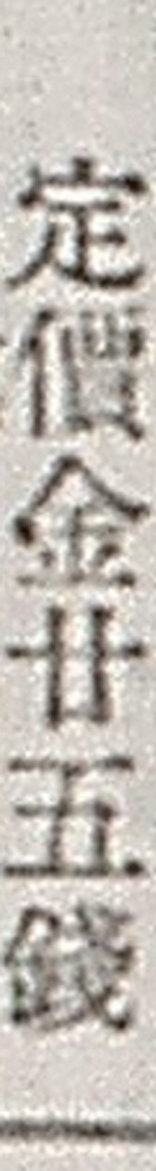定価金廿五銭
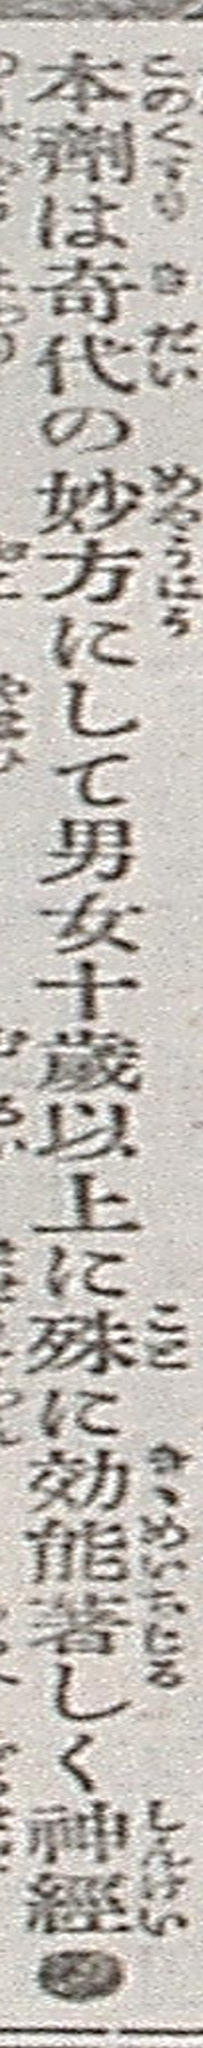本剤は奇大の妙方にして男女十歳以上に殊に効能著しく神経●
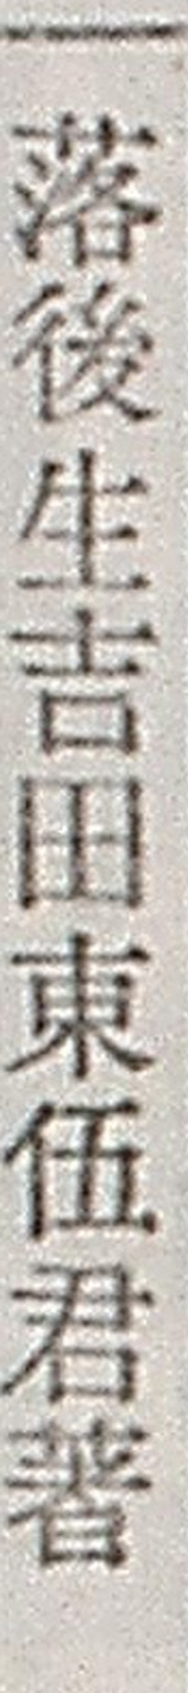落後生吉田東伍君著
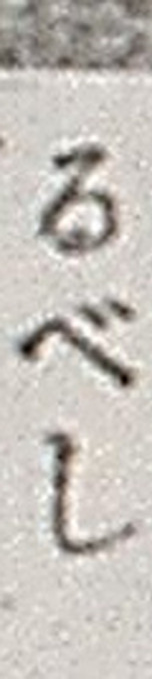るべし
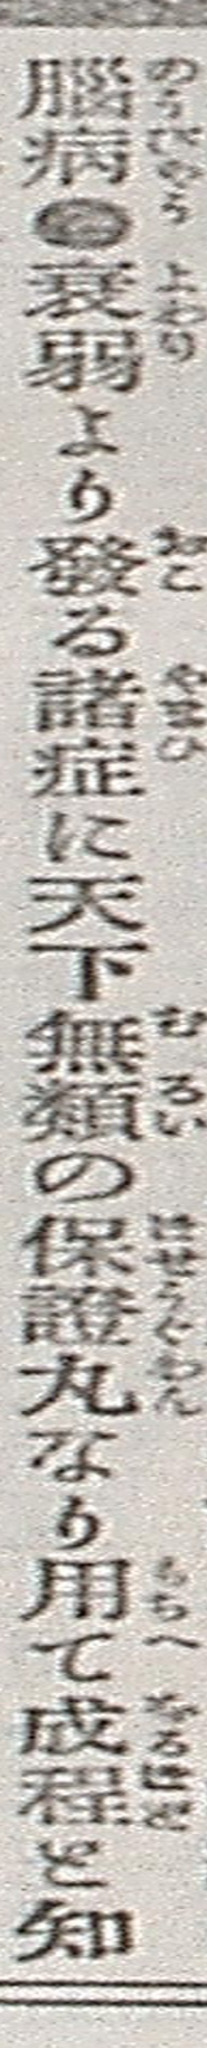脳病●衰弱より発る諸症に天下無類の保證丸なり用て成程と知
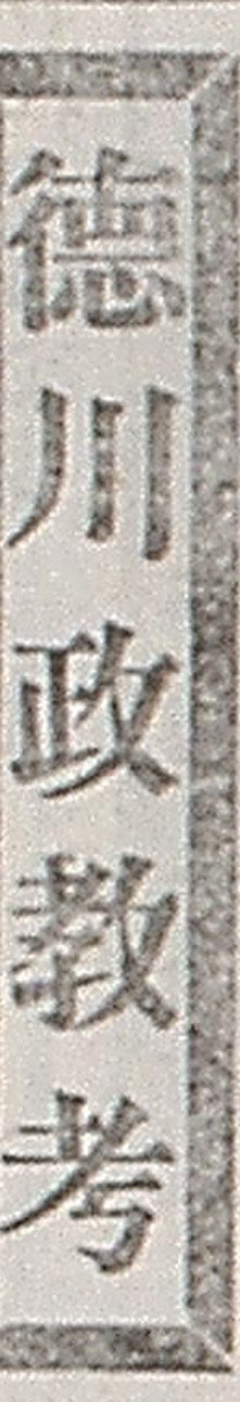徳川政教考
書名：風俗畫報臨時増刊第百二十號　大海嘯被害録（下）
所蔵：東京大学地震研究所図書室 Earthquake Research Institute Library, The University of Tokyo, JAPAN
